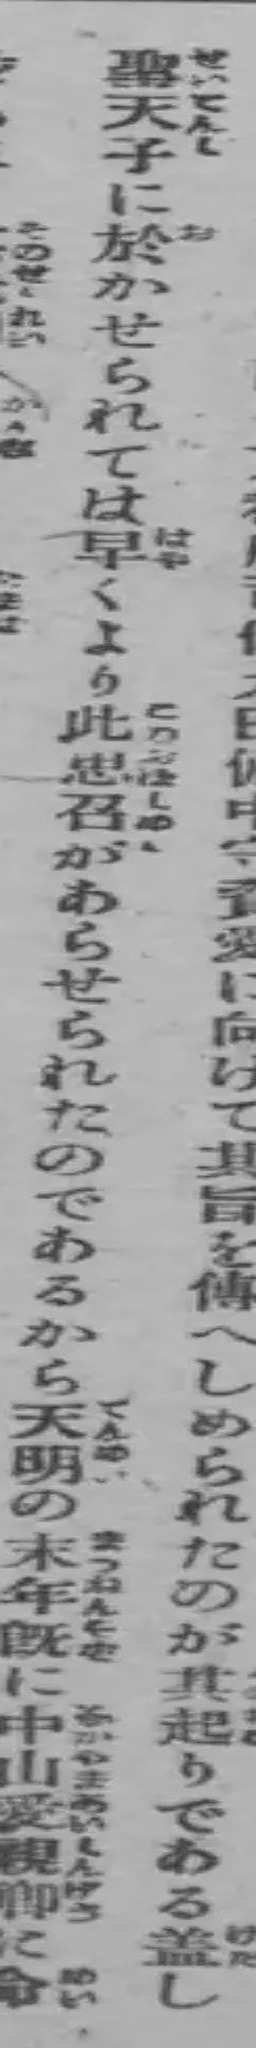聖天子に於かせられては早くより此思召があらせられたのであるから天明の末年既に中山愛親卿に命
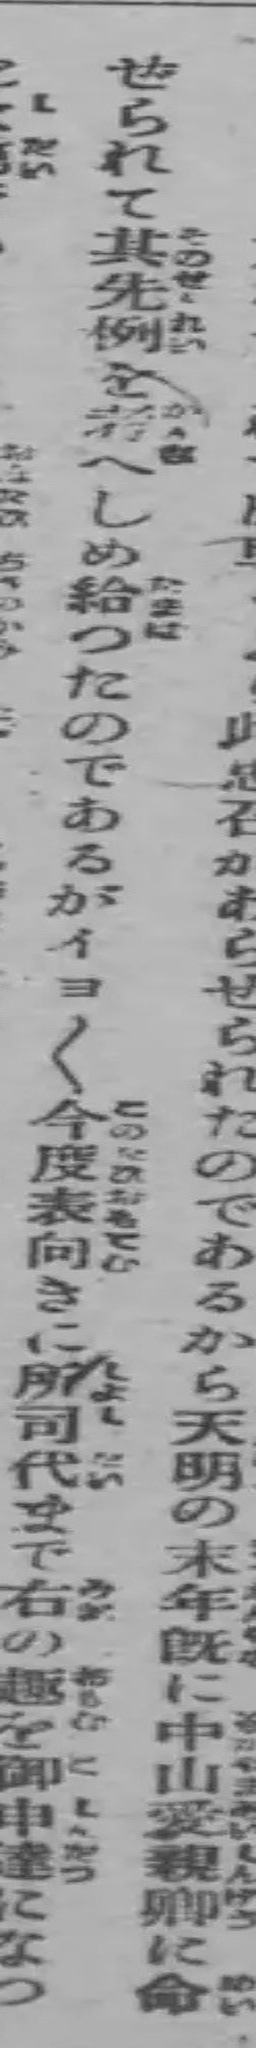ぜられて其先例を考へしめ給つたのであるがイヨ〳〵今度表向きに所司代まで右の趣を御申達になつ
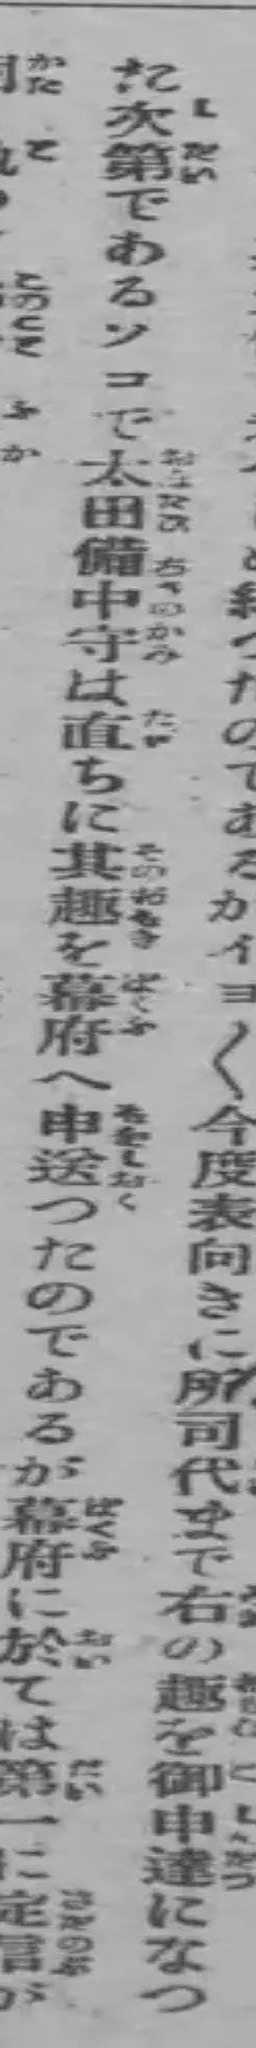た次第であるソコで太田備中守は直ちに其趣を幕府へ申送つたのであるが幕府に於ては第一に定信が
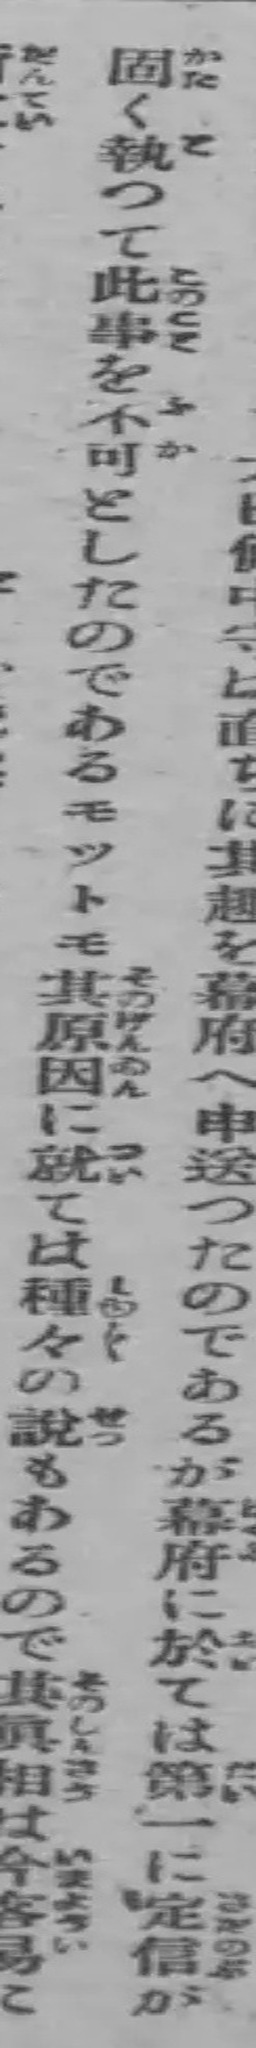定信の意見固く執つて此事を不可としたのであるモツトモ其原因に就ては種々の説もあるので其真相は今容易に
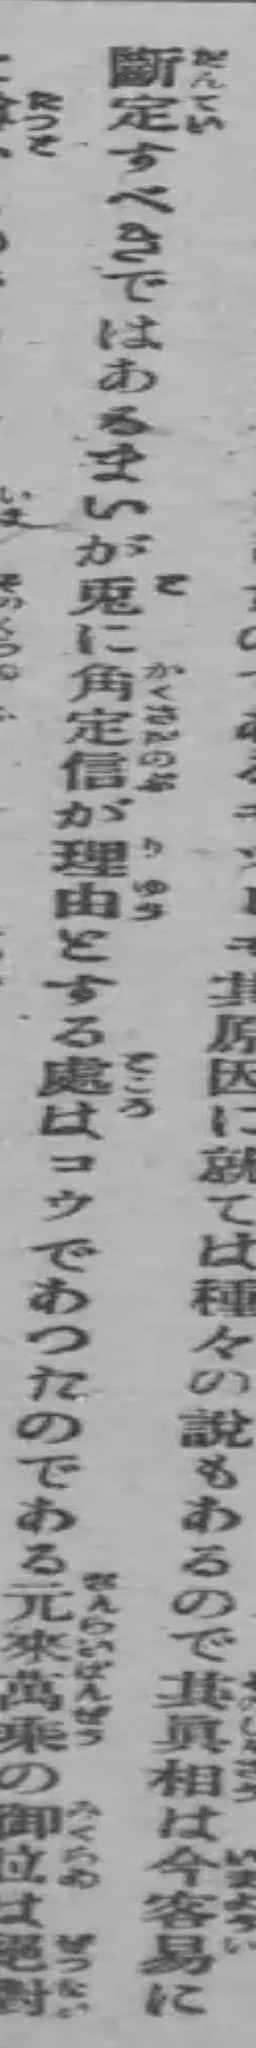断定すべきではあるまいが兎に角定信が理由とする処はコウであつたのである元来万乗の御位は絶対
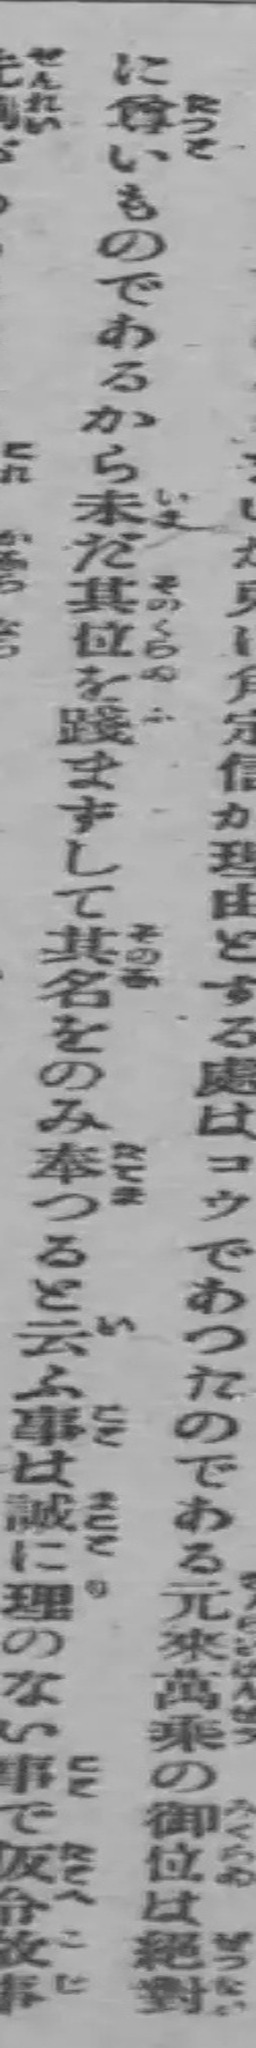に尊いものであるから未だ其位を践まずして其名をのみ奉つると云ふ事は誠に理のない事で仮令故事
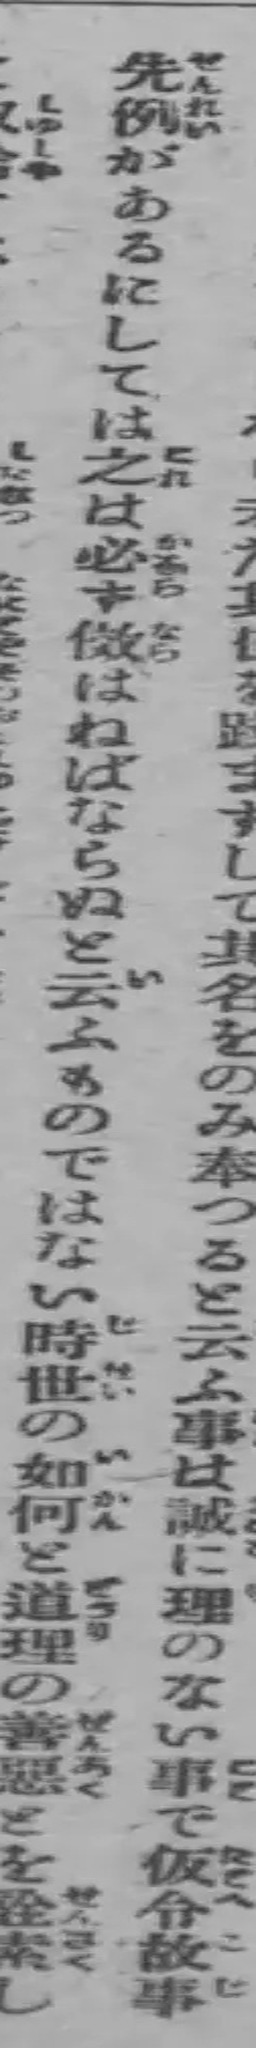先例があるにしては之は必ず倣はねばならぬと云ふものではない時世の如何と道理の善悪とを詮索し
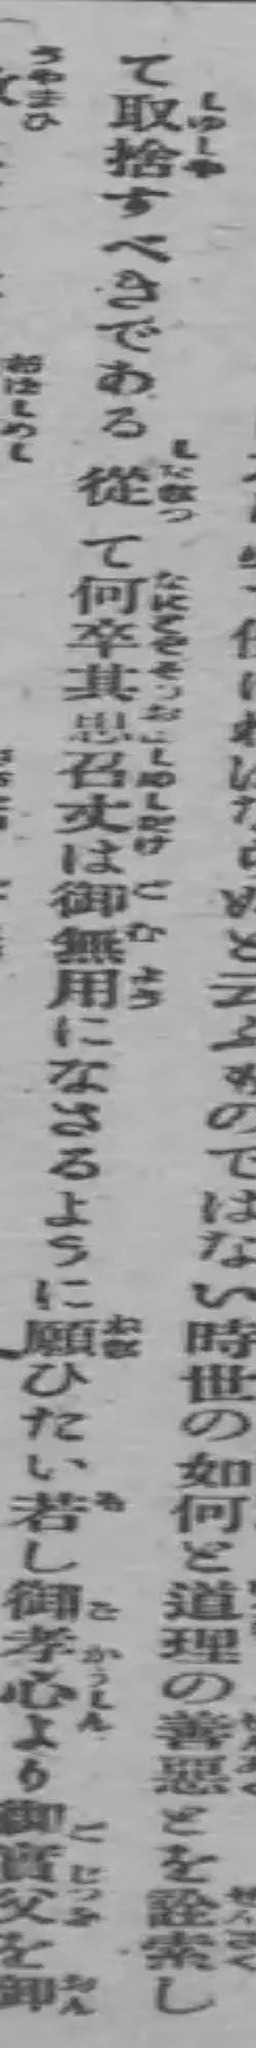て取捨すべきである従て何卒其思召丈は御無用になさるように願ひたい若し御孝心より御実父を御
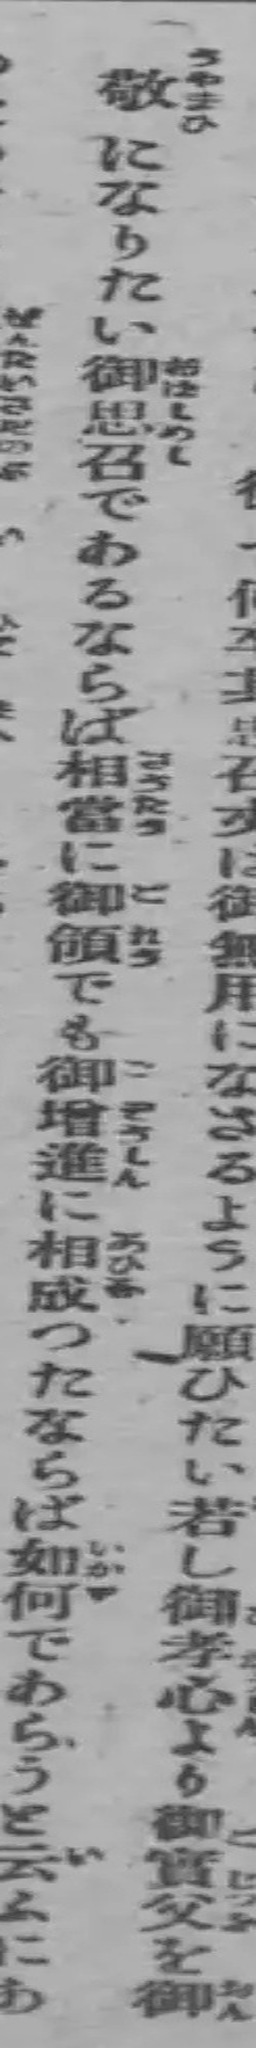敬になりたい御思召であるならば相当に御領でも御増進に相成つたならば如何であらうと云ふにあ
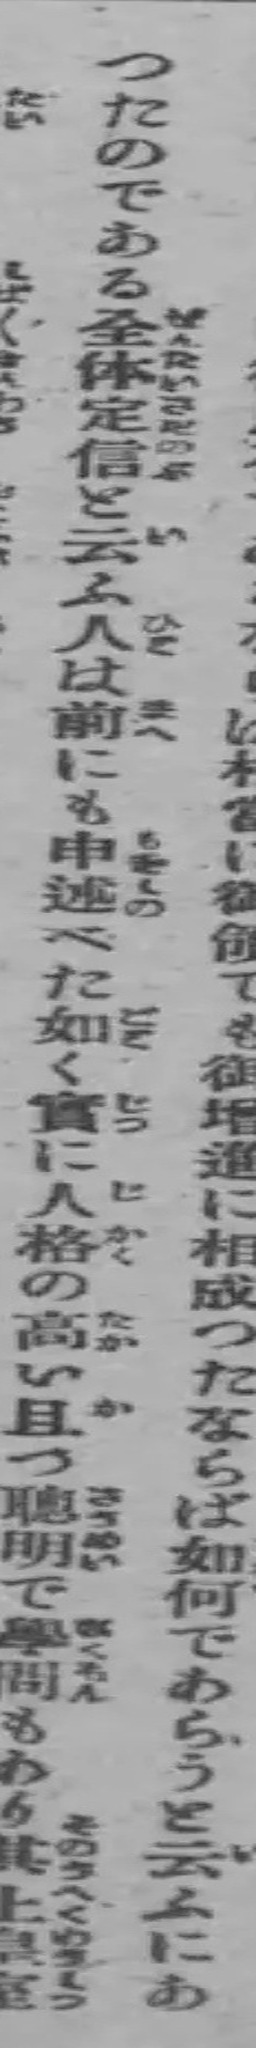つたのである全体定信と云ふ人は前にも申述べた如く実に人格の高い且つ聡明で学問もあり其上皇室
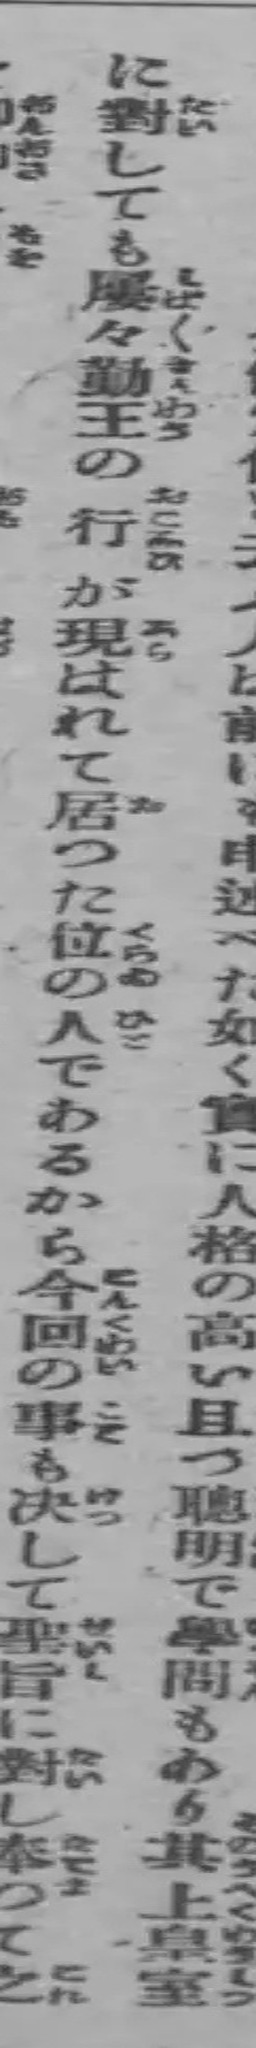に対しても屡々勤王の行が現はれて居つた位の人であるから今回の事も決して聖旨に対し奉つて之
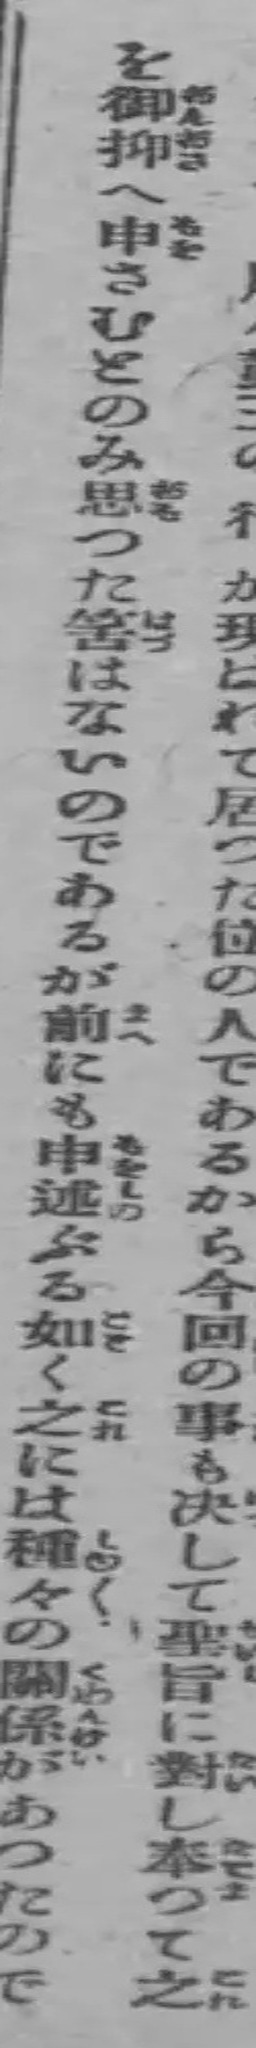を御抑へ申さむとのみ思つた筈はないのであるが前にも申述ぶる如く之には種々の関係があつたので
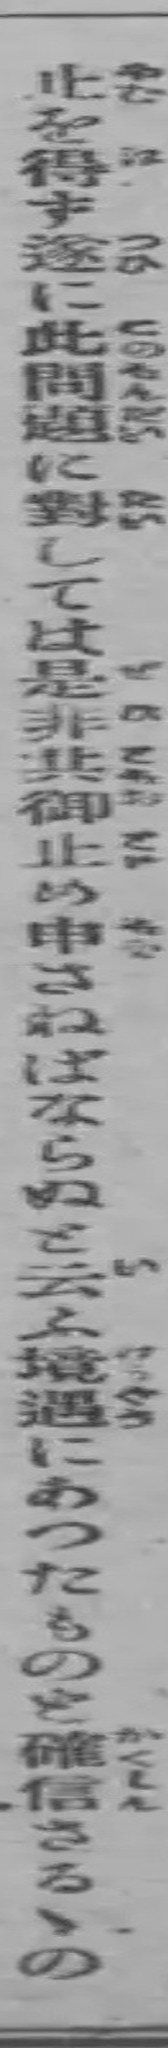止を得ず遂に此問題に対しては是非共御止め申さねばならぬと云ふ境遇にあつたものと確信さるゝの
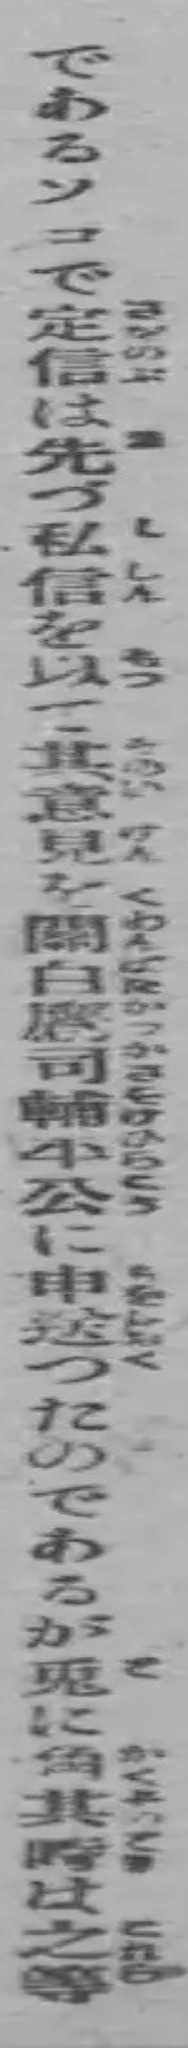であるソコで定信は先づ私信を以て其意見を関白鷹司輔平公に申送つたのであるが兎に角其時は之等
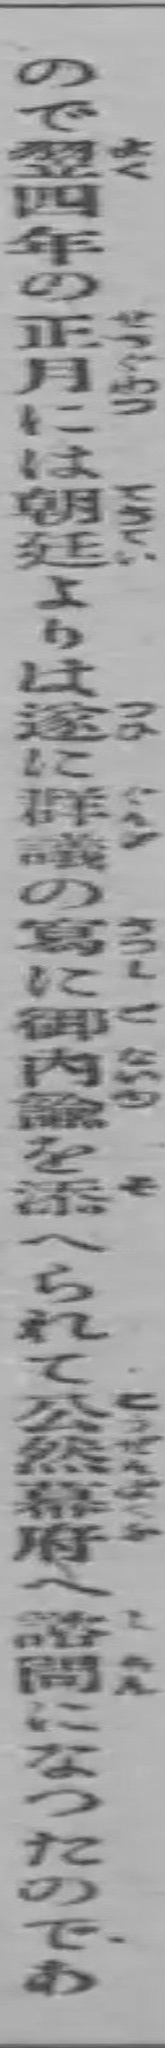ので翌四年の正月には朝廷よりは遂に群議の写に御内諭を添へられて公然幕府へ諮問になつたのであ
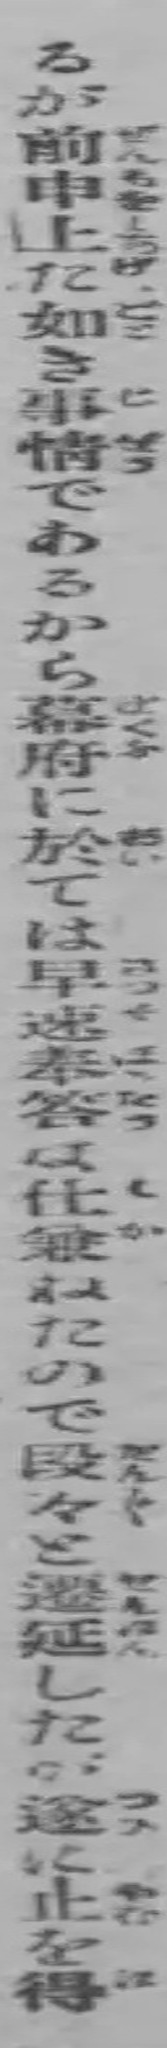るが前申上た如き事情であるから幕府に於ては早速奉答は仕兼ねたので段々と遷延したが遂に止を得
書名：豊橋市史談
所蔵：国立国会図書館 National Diet Library, JAPAN
